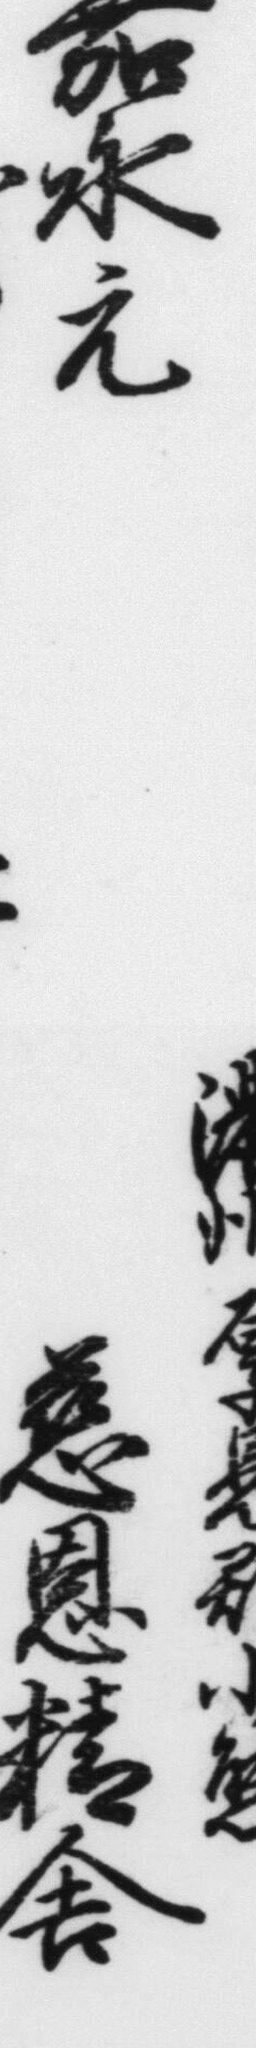嘉永元慈恩精舎
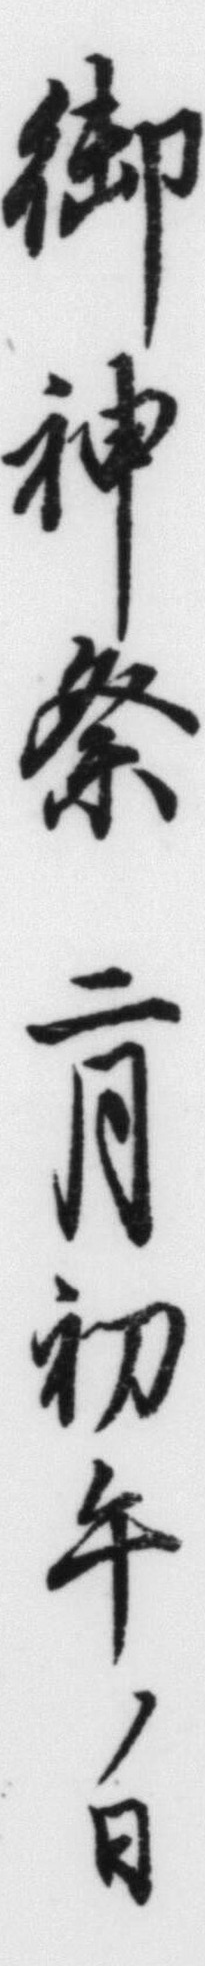御神祭二月初午ノ日
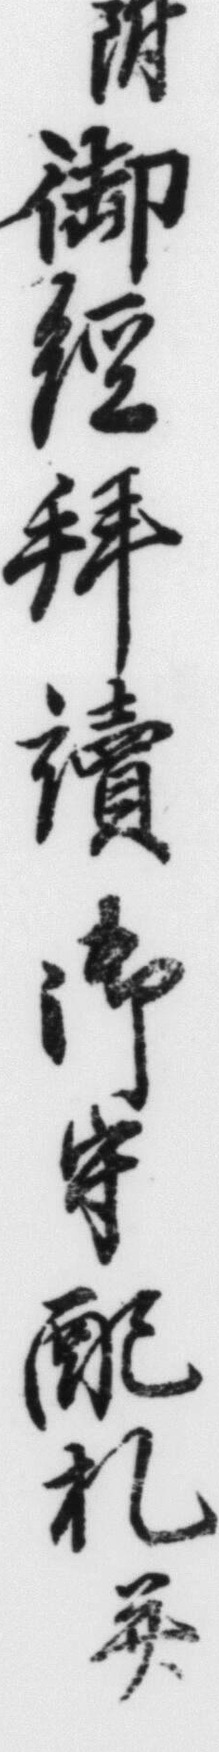附御経拝読御守配札并
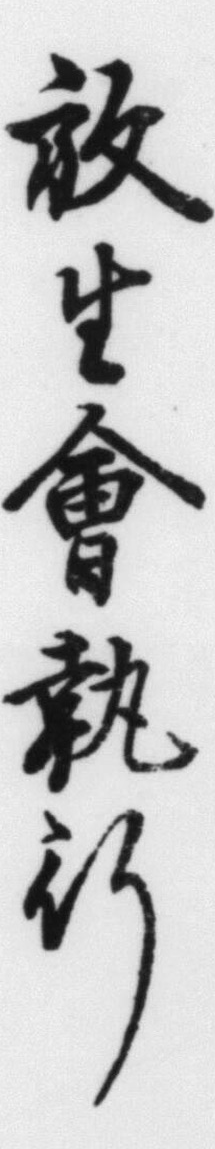放生会執行
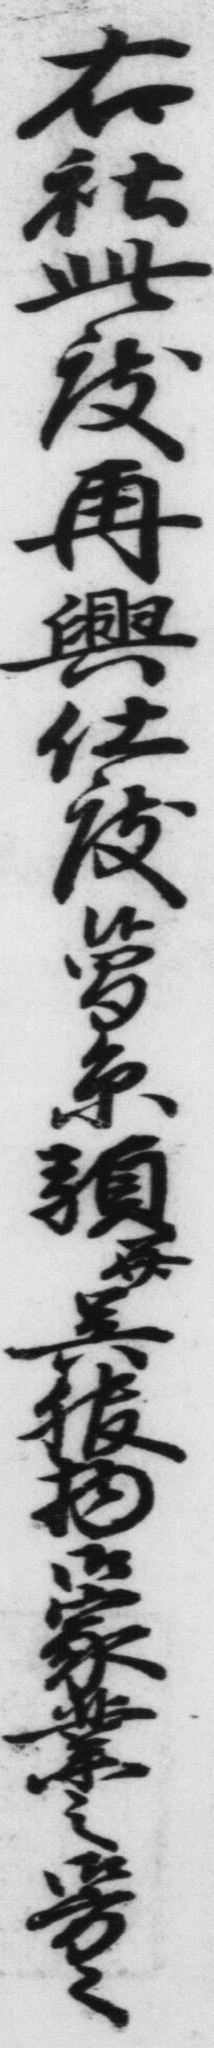右社此度再興仕度候間糸類并呉服物御家業之御方々
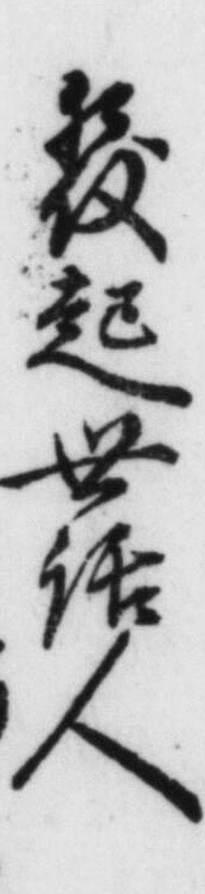発起世話人
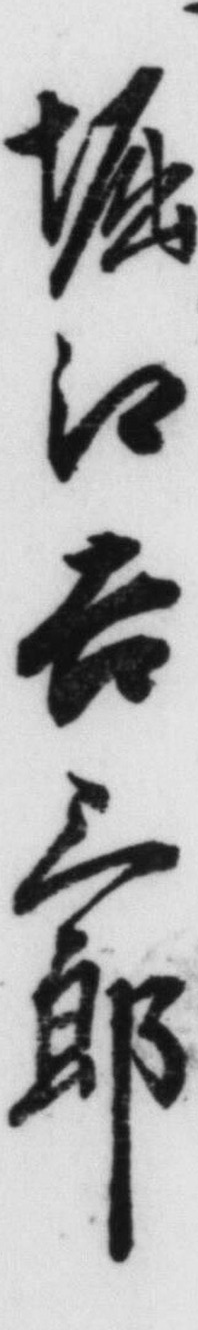堀江吉三郎
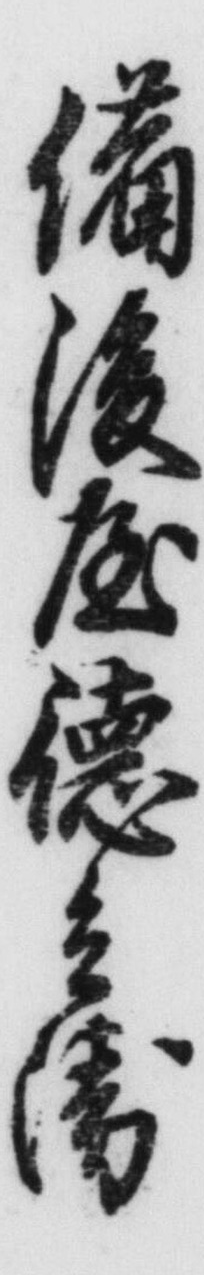備後屋徳兵衛
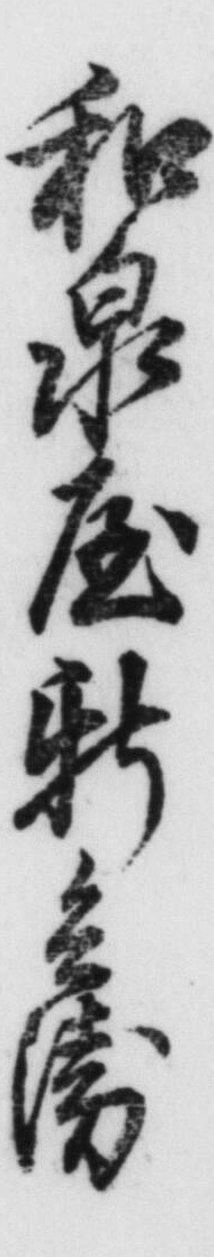和泉屋新兵衛
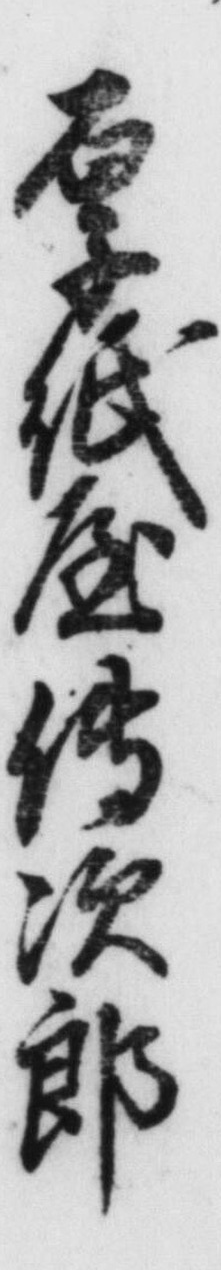厚紙屋伝次郎
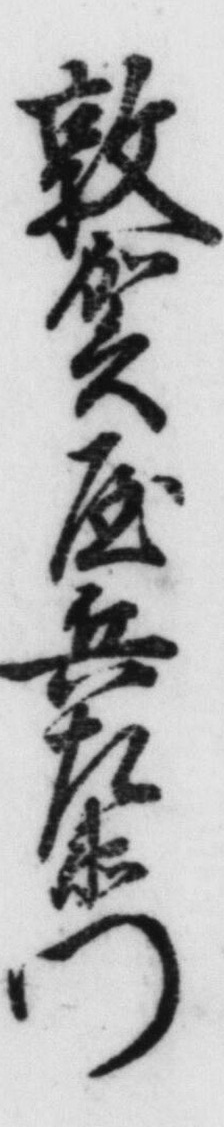敦賀屋兵左衛門
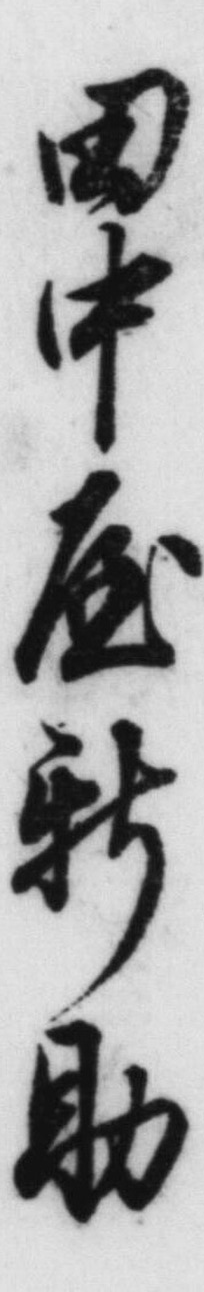田中屋新助
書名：蚕養守護神畧縁起
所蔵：岐阜県図書館 国文学研究資料館
